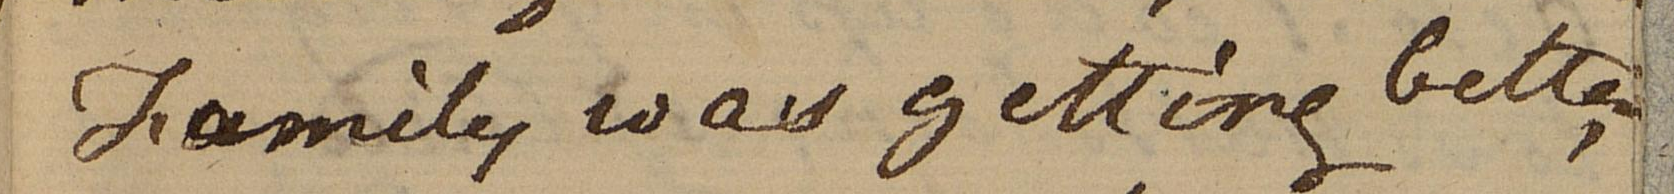Family was getting better
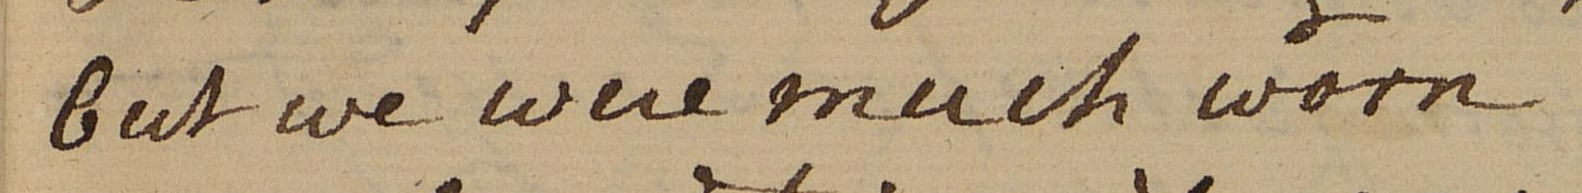but we were much worn
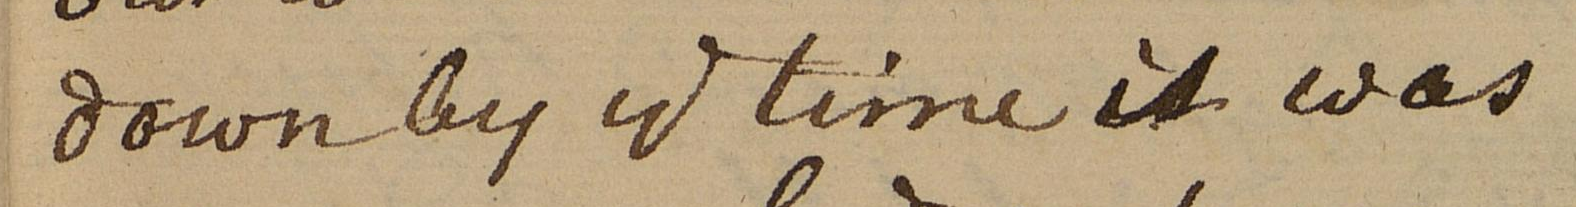down by y^e time it was
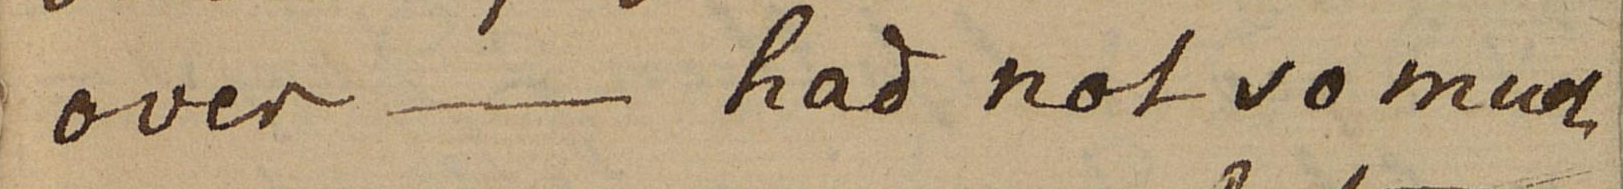over- had not so much
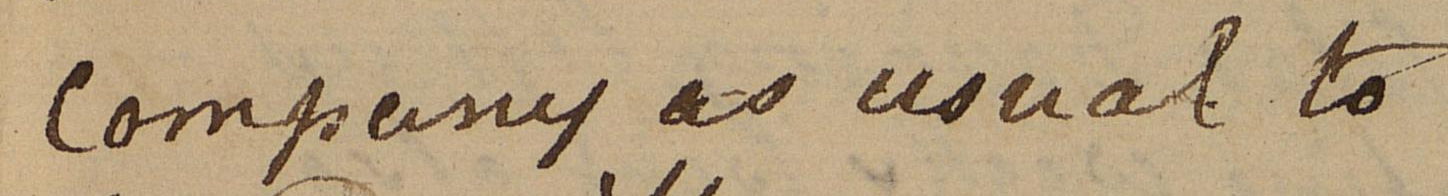Company as usual to
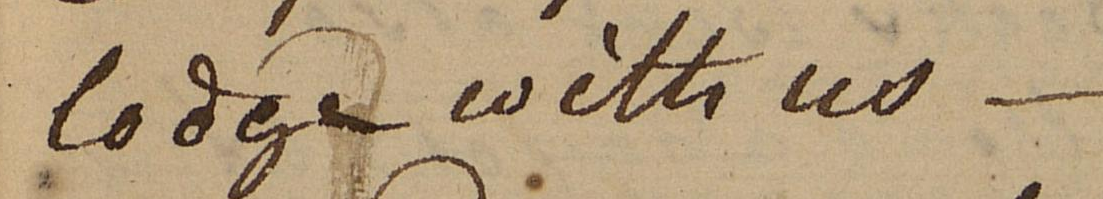lodge with us-
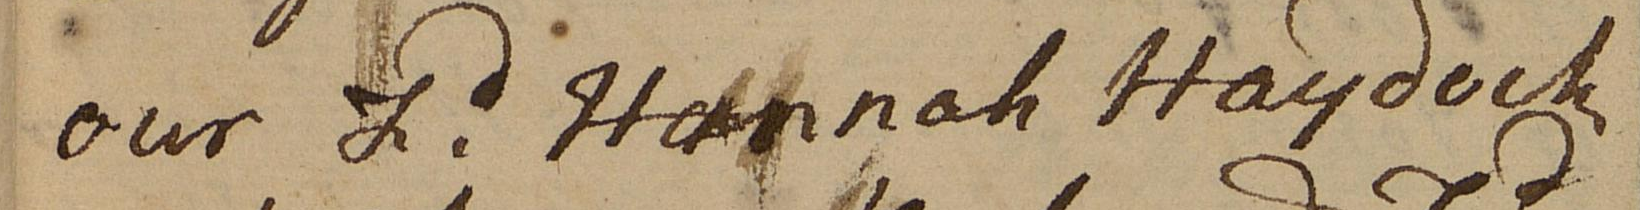our F^d. Hannah Haydock
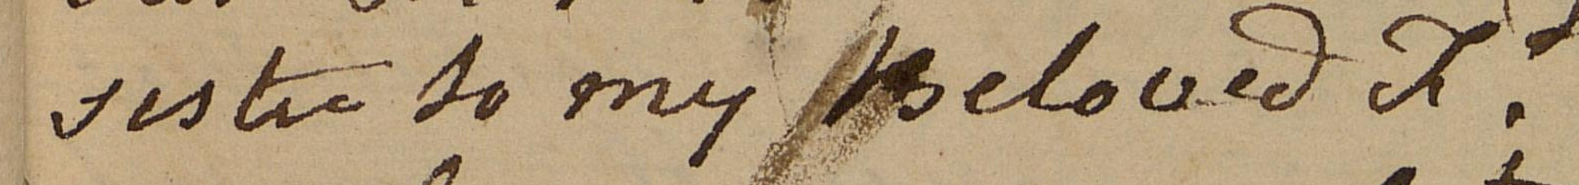sister to my Beloved F^d,
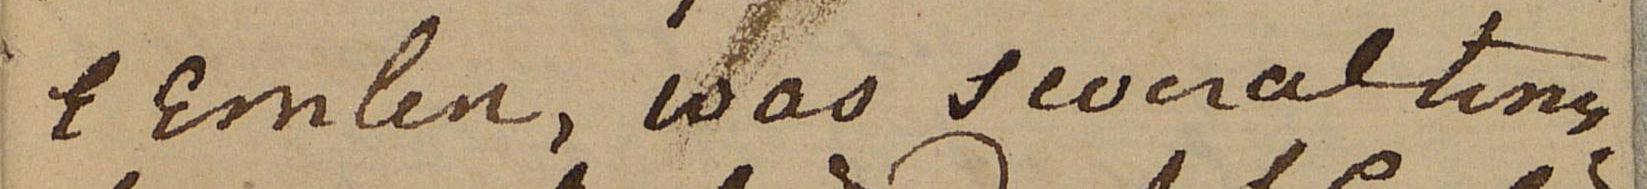E Emlen, was several tiny
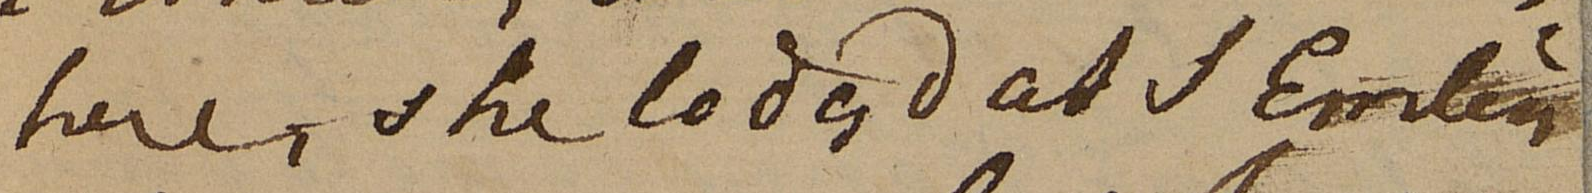here, she lodgd at S Emlen^s
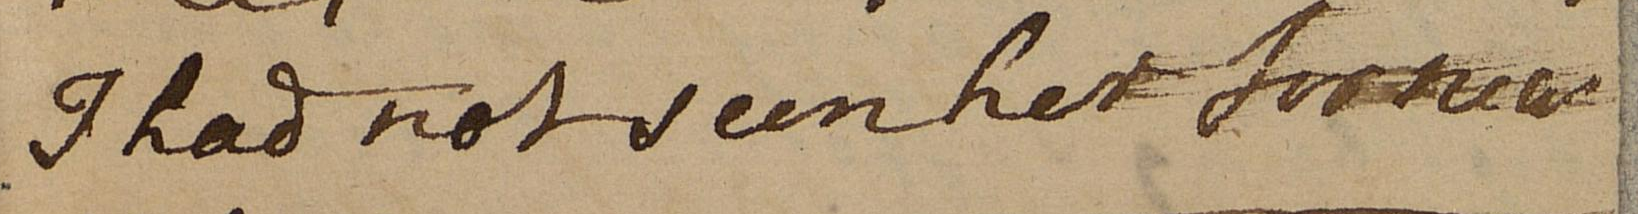I had not seen her for now
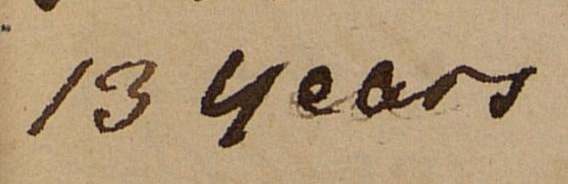13 years
